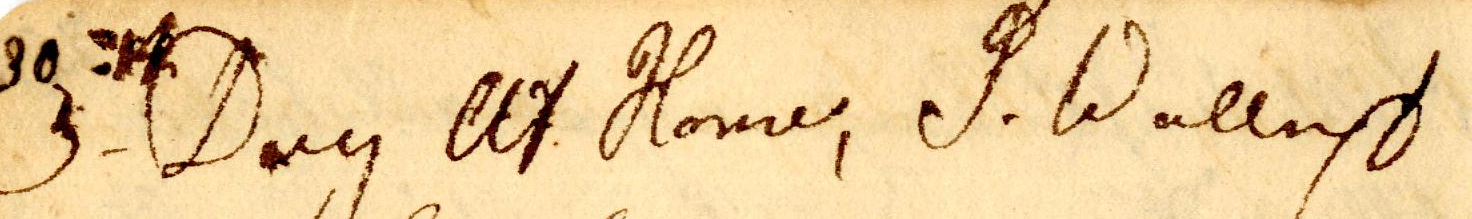5^th Day At Home, S. Waln
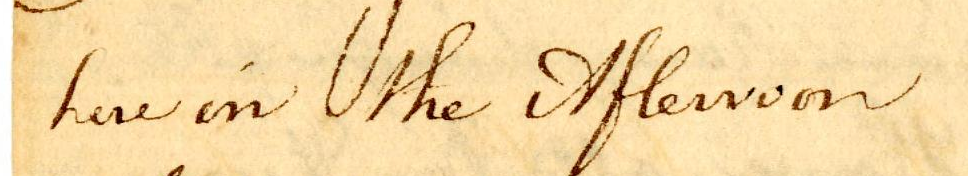here in the Afternoon
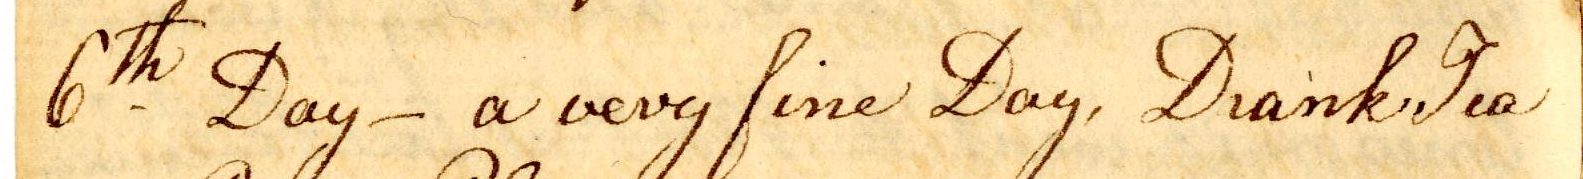6^th Day- a very fine Day, Drank Tea
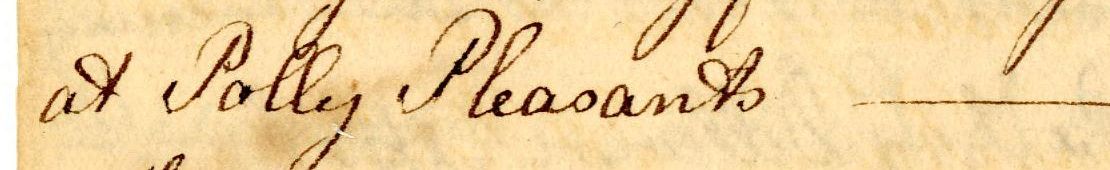at Polly Pleasants-
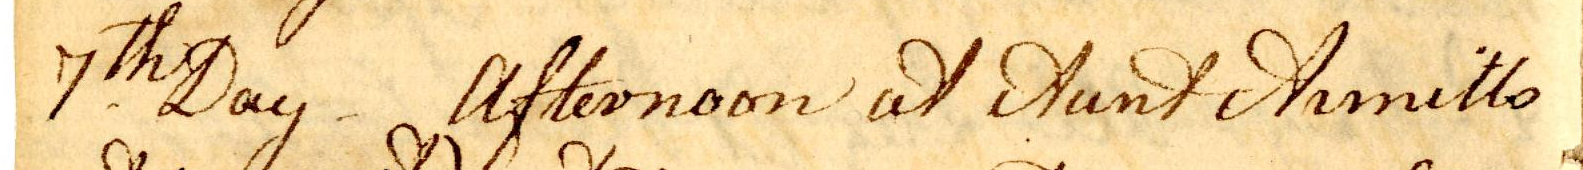7^th. Day- Afternoon at Aunt Armitts
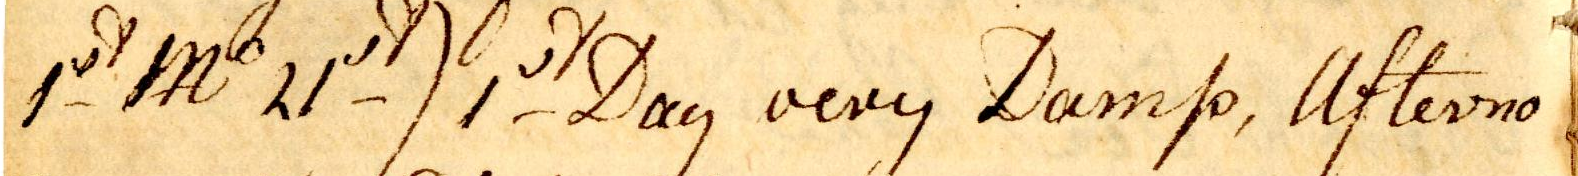1^st M^o 21^st) 1^st Day very Damp, Afterno
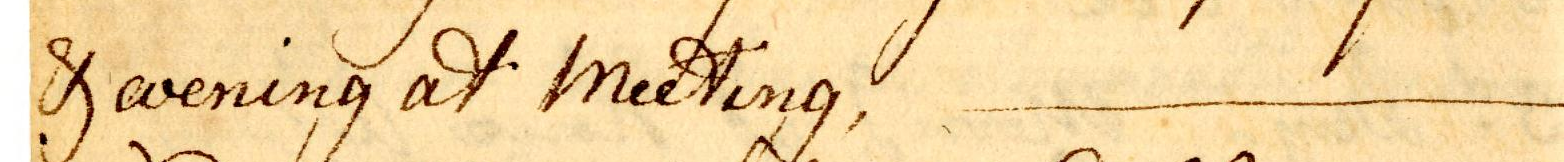& evening at Meeting,-
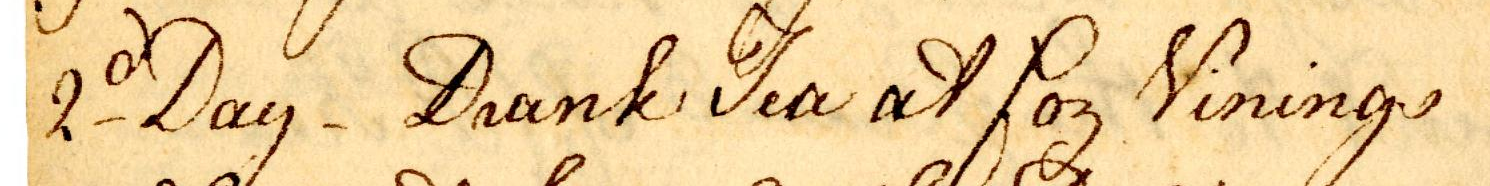2^d Day- Drank Tea at Coz Vinings
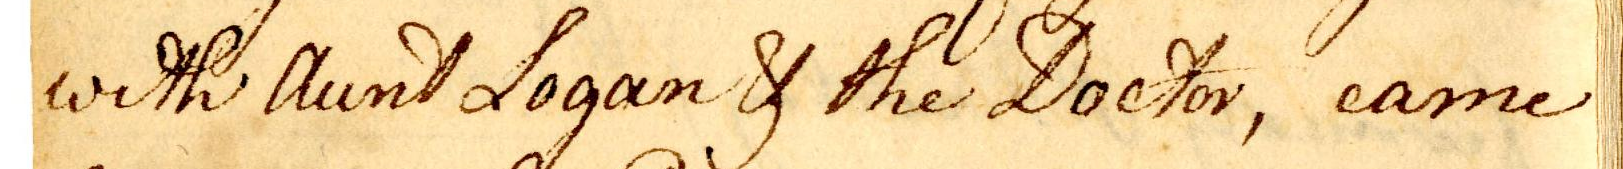with Aunt Logan & the Doctor, came
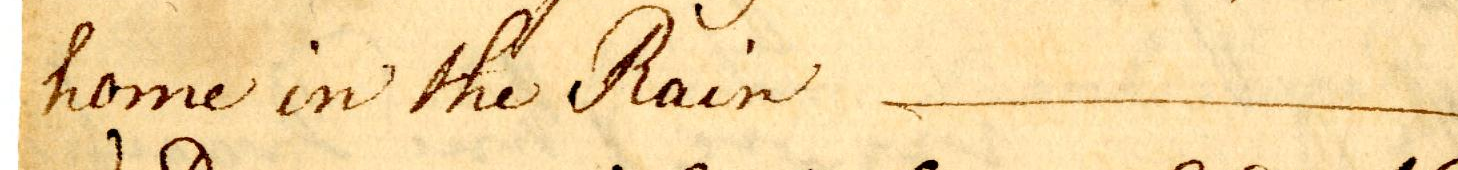home in the Rain-
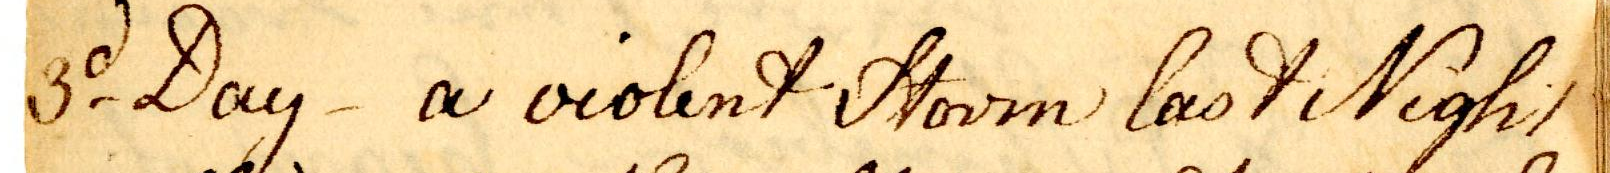3^d Day- a violent Storm last Night
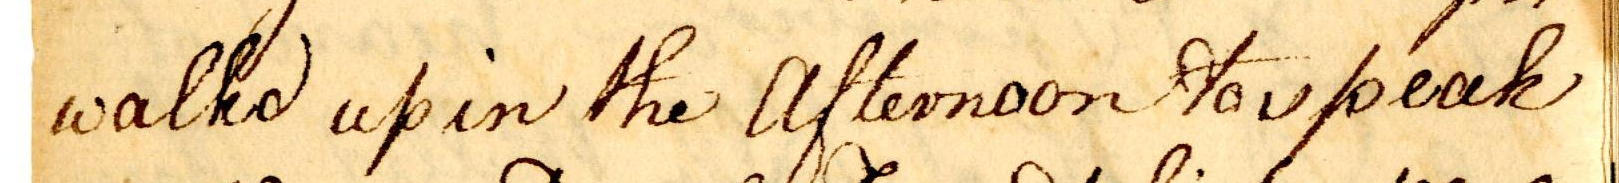walkd up in the Afternoon to speak
